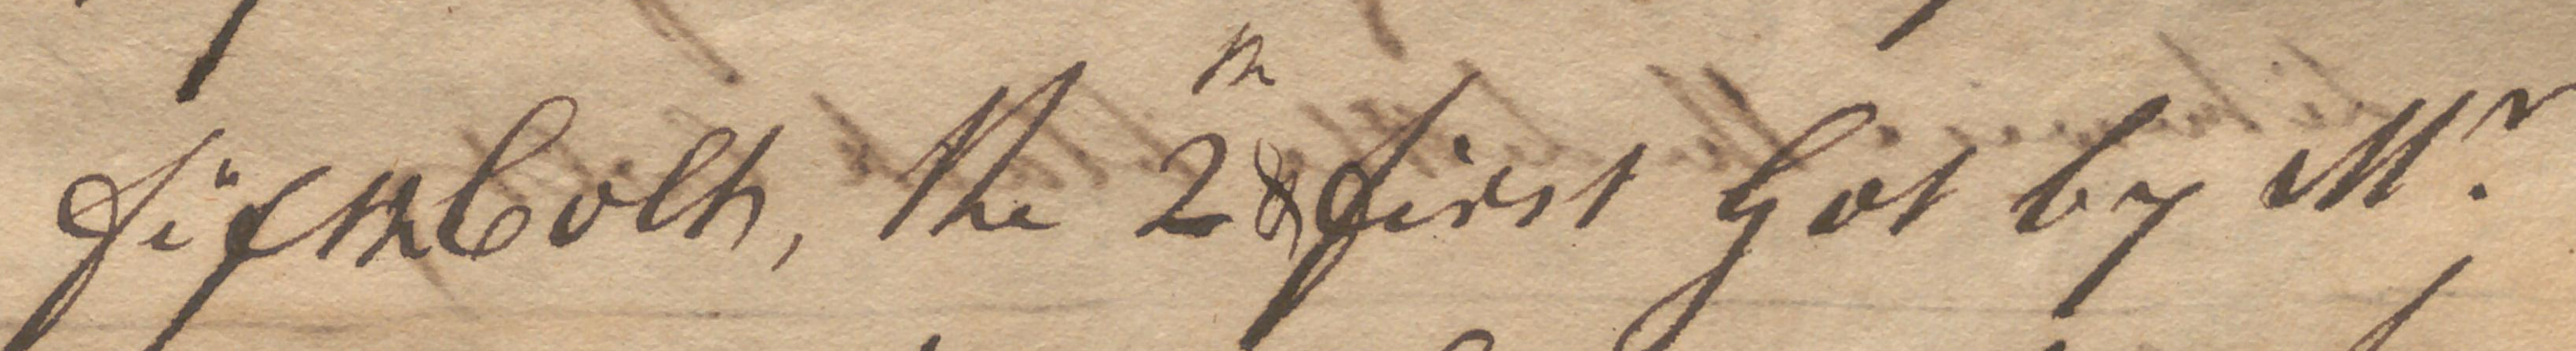fifth Colt, the 2^th & first Got by M^r.
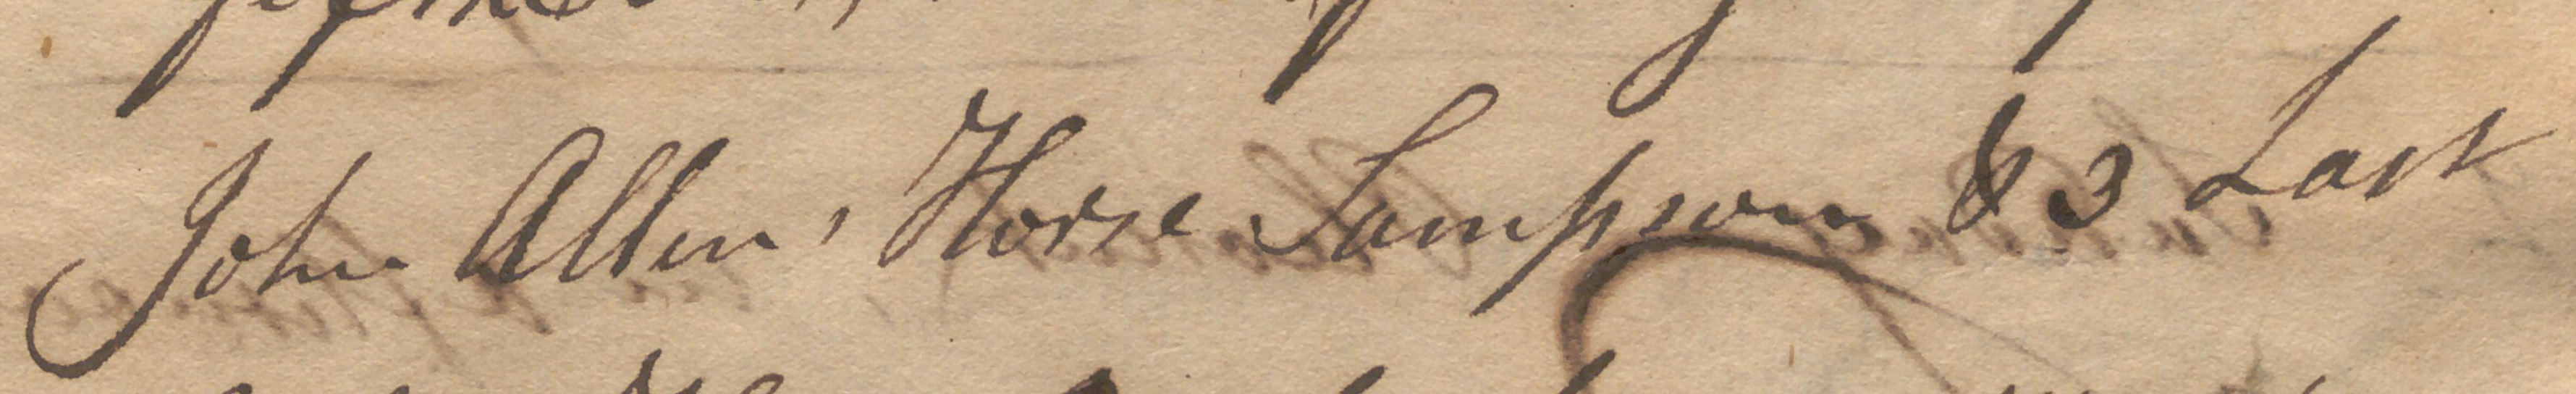Johe Allens Horse Sampson & 3 Last
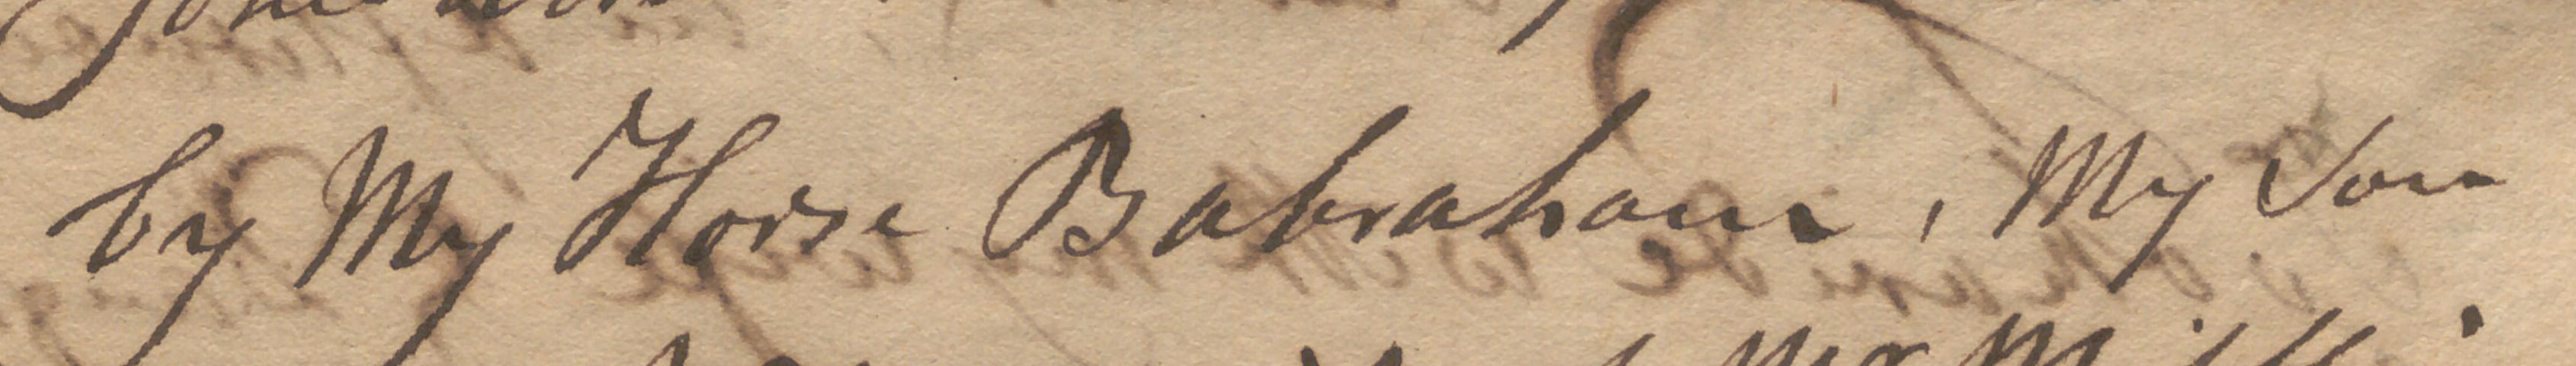by My Horse Babraham, My Son
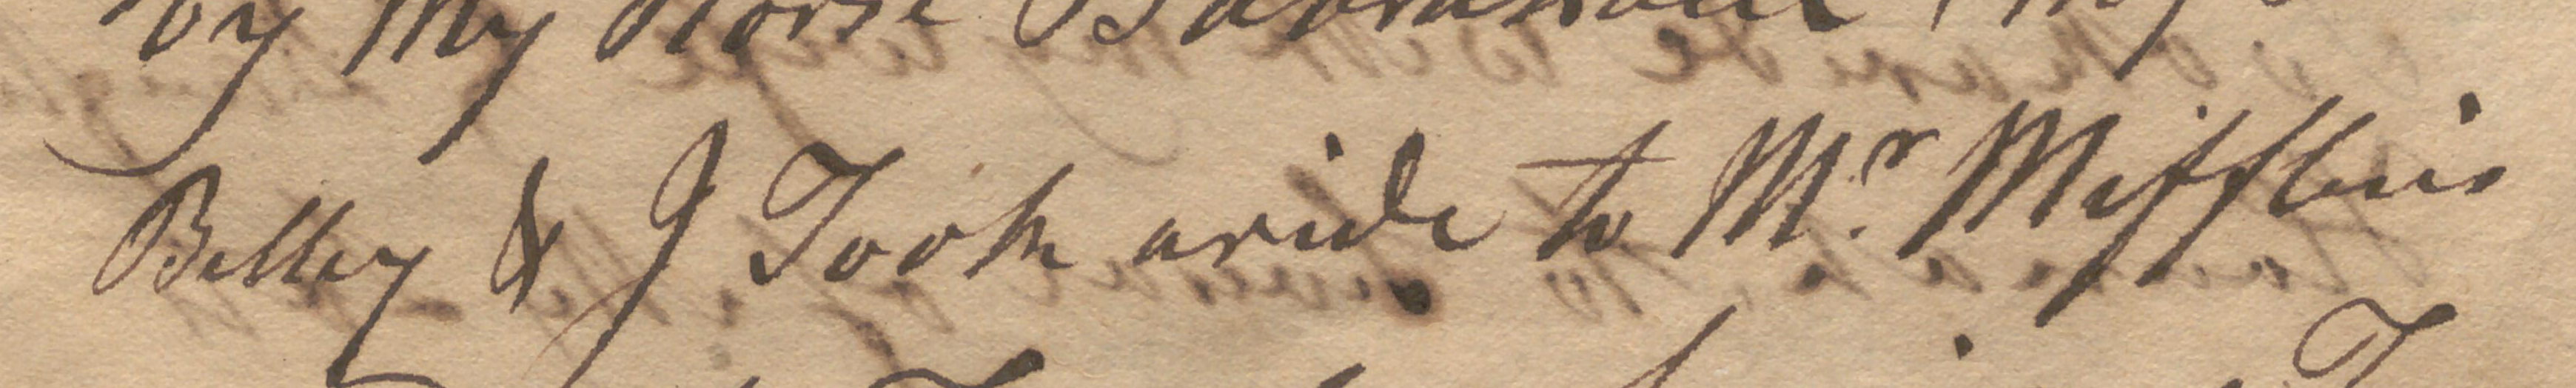Billey & I Took a ride to M^r. Mifflins
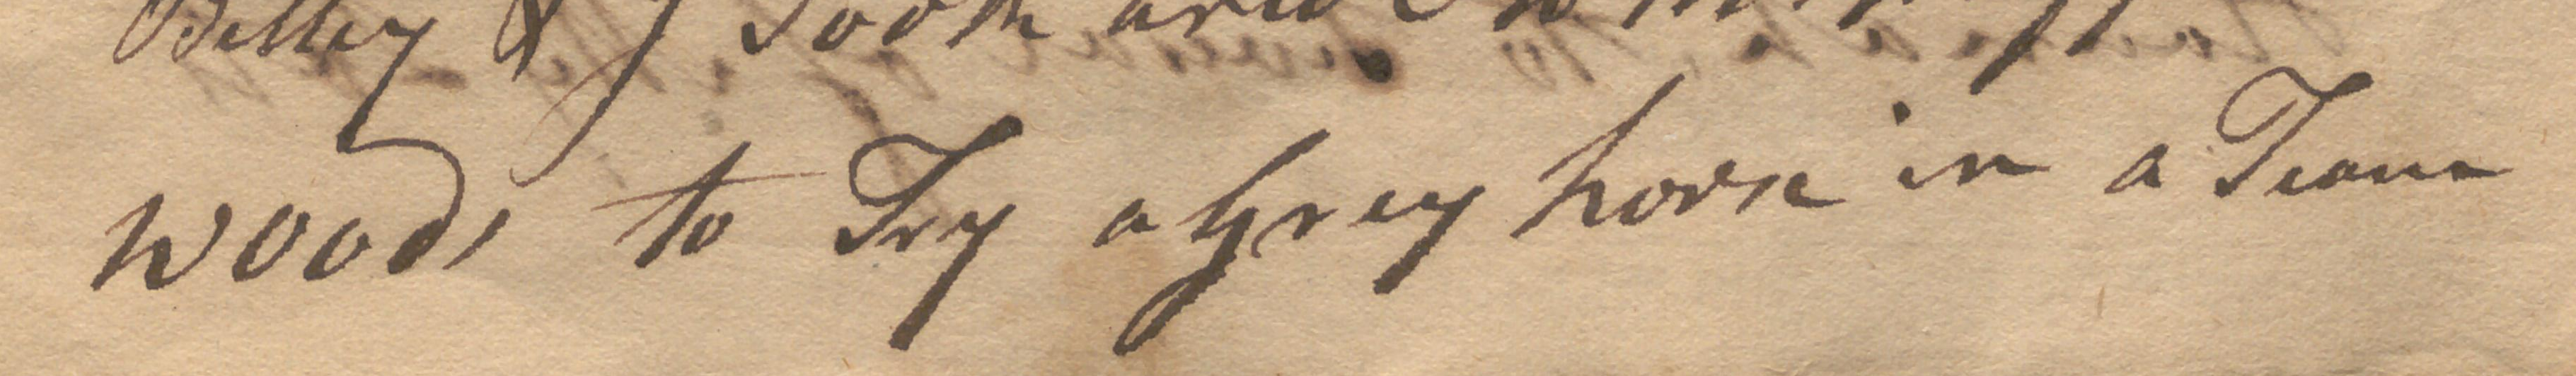woods to Try a Grey horse in a Team
